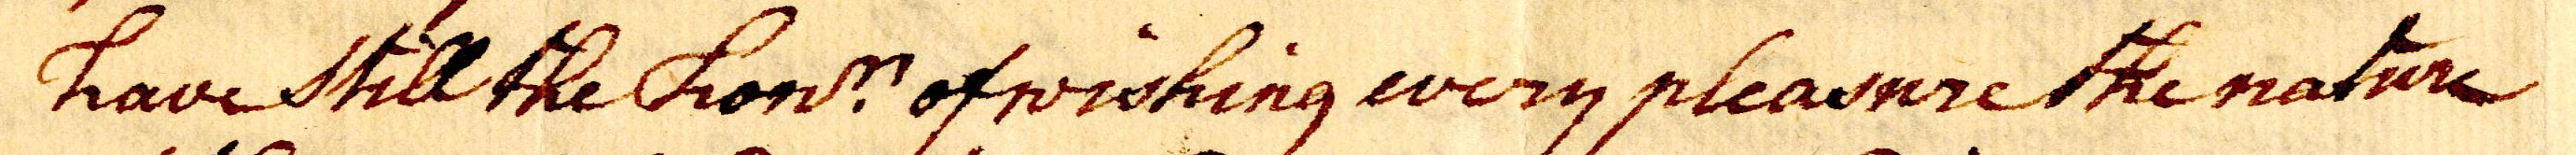have still the hon^r. of wishing every pleasure the nature
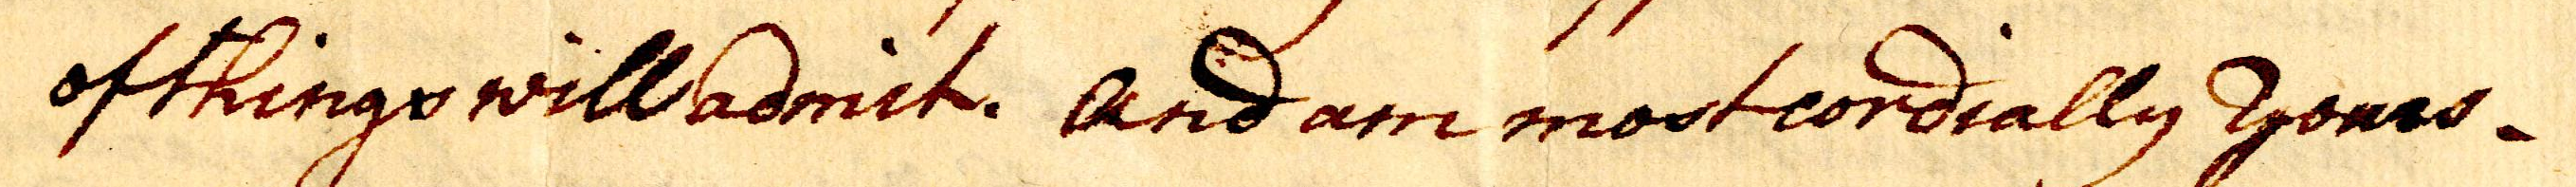of things will admit. And am most cordially Yours-
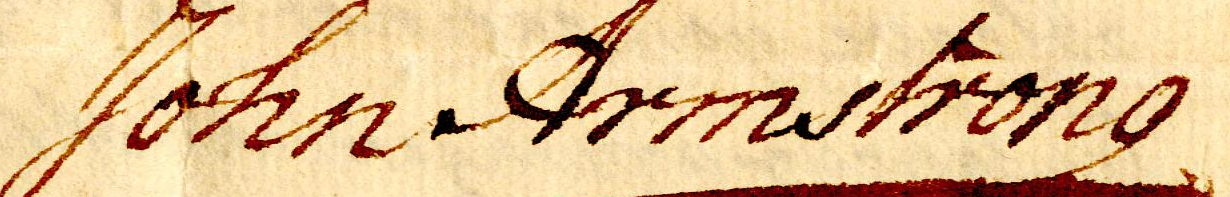John Armstrong
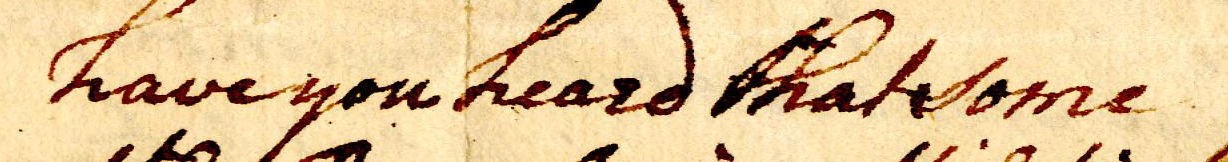have you heard that some
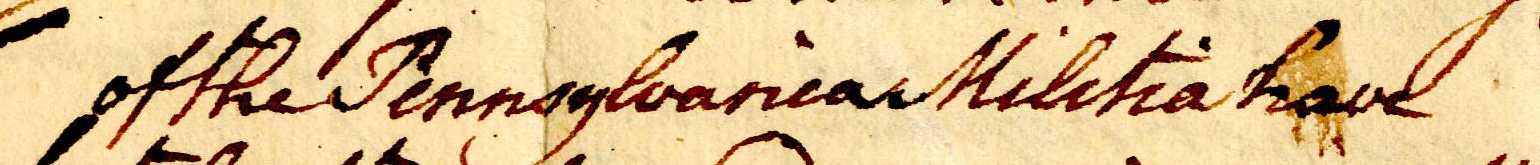of the Pennsylvania Militia have
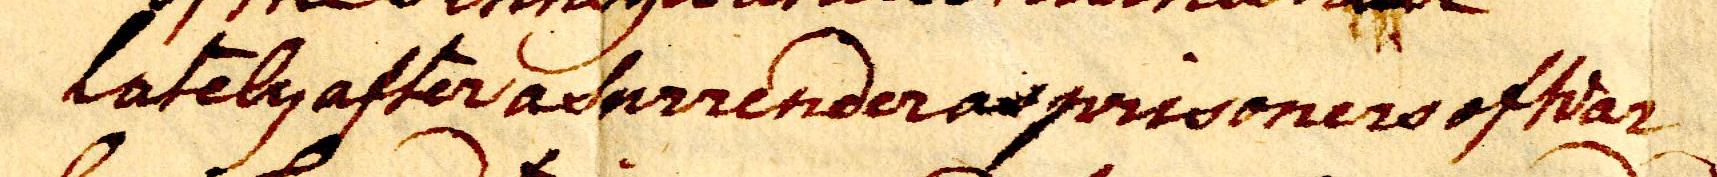lately after a Surrender as prisoners of war
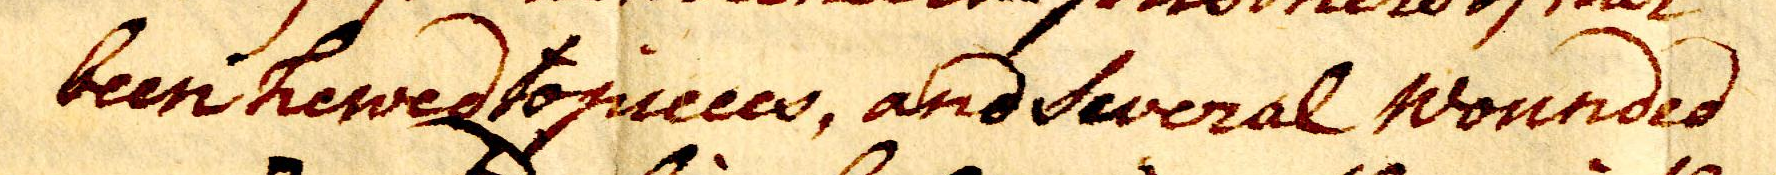been hewed to pieces, and several Wounded
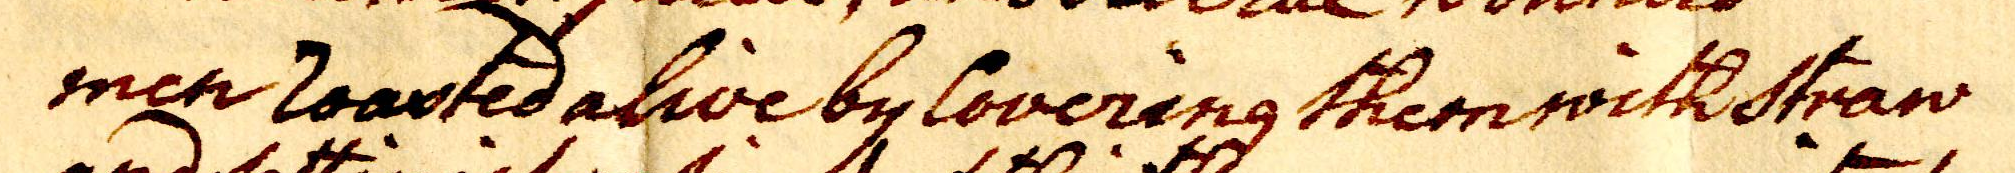men roasted alive by Covering them with Straw
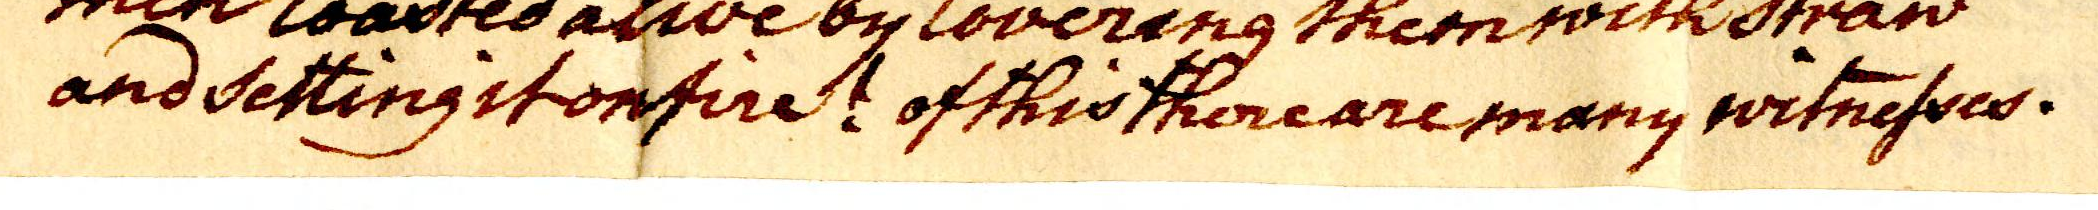and setting it on fire? of this there are many witnesses.
